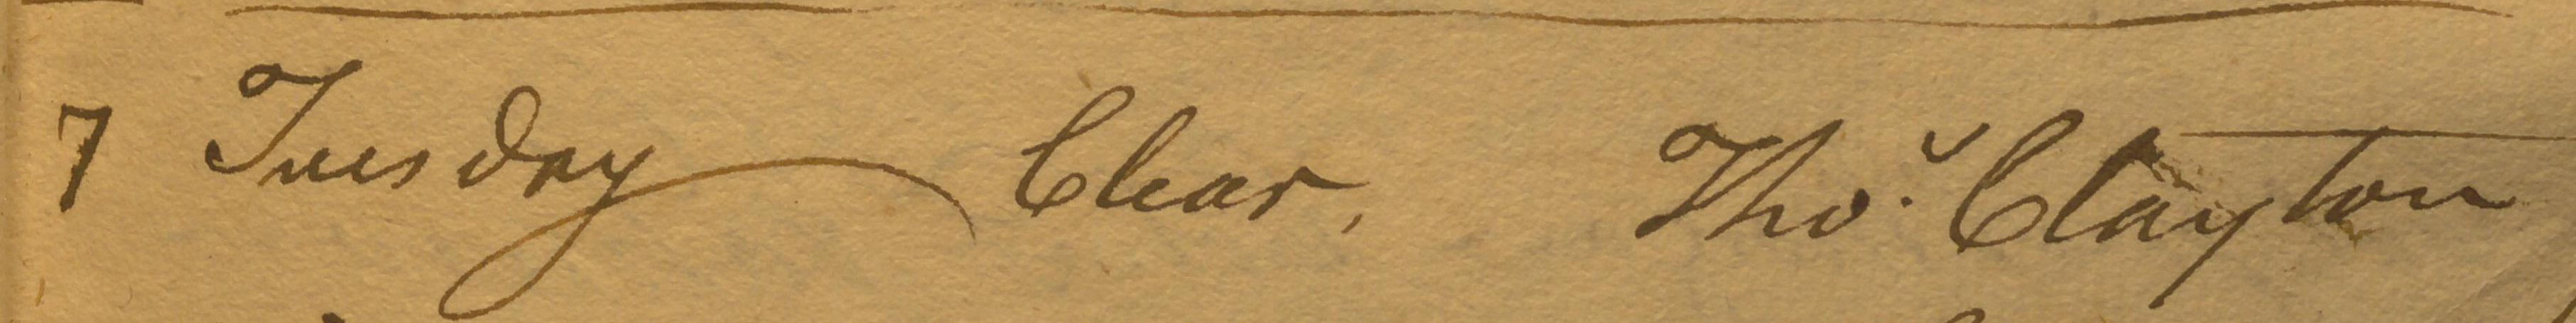7 Tuesday Clear Tho^s. Clayton
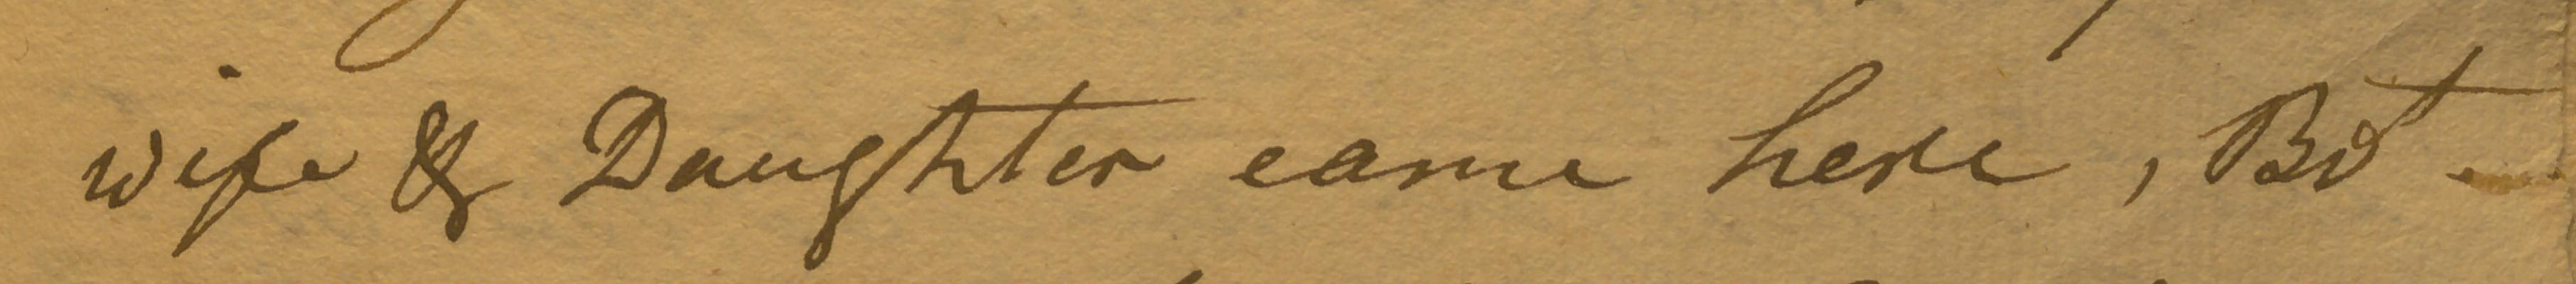wife & Daughter came here, Bo^t
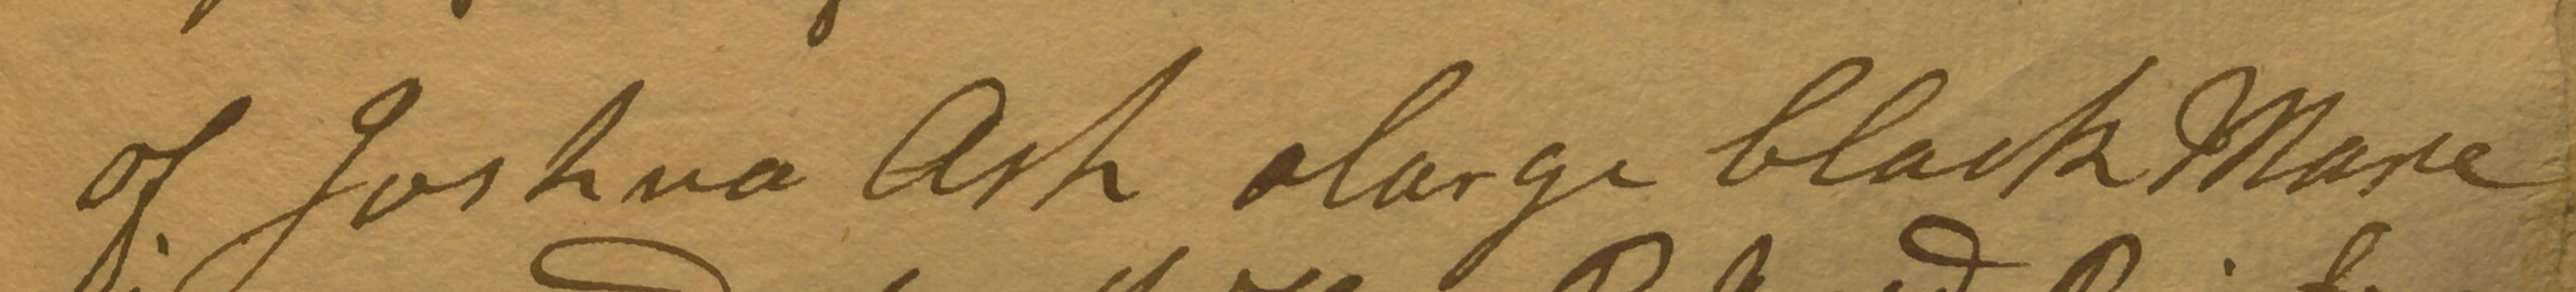of Joshua Ash a large black Mare
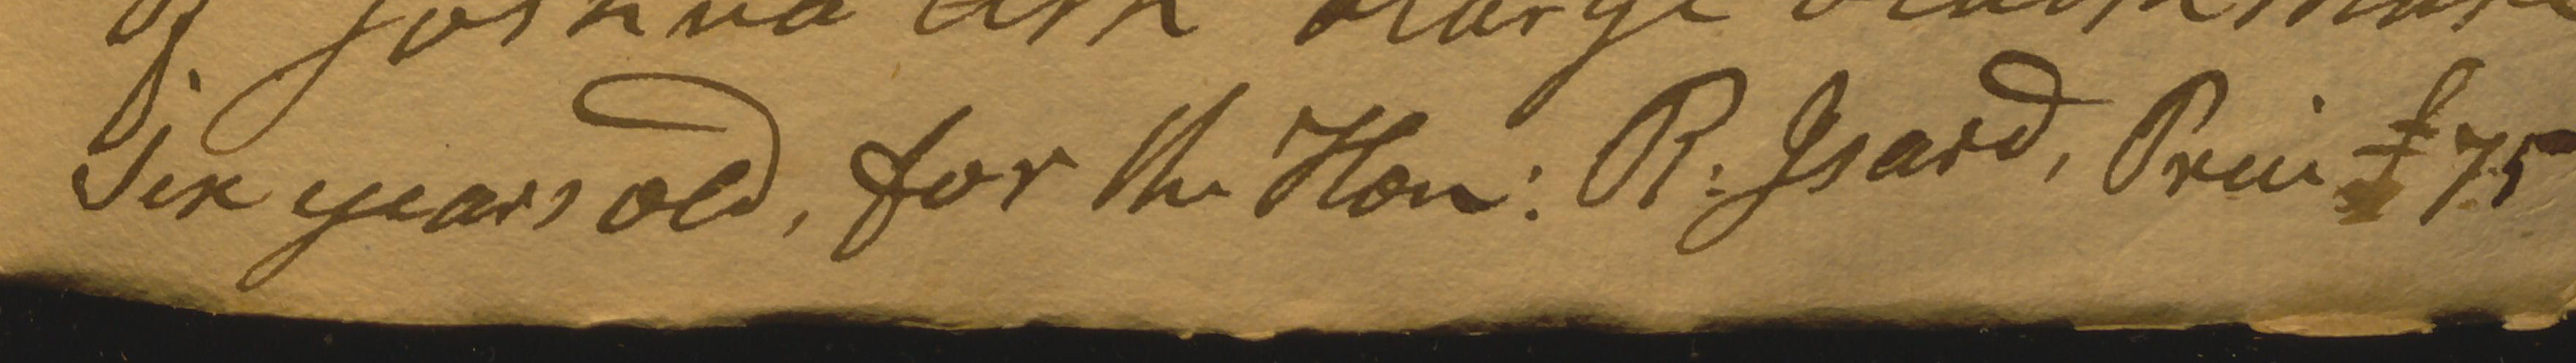six years old. for the Hon: R: Isard. Price £7.5
